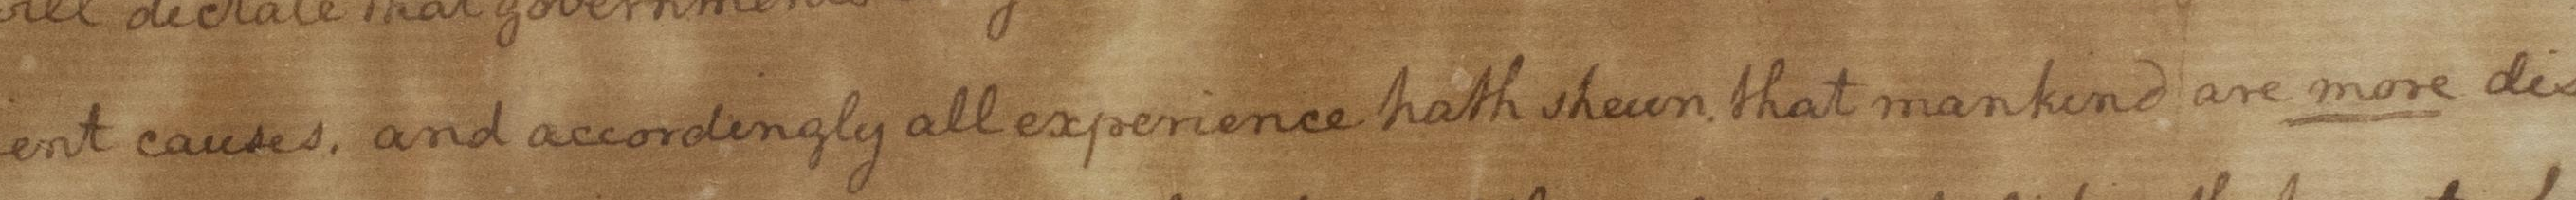-ient causes, and accordingly all experience hath shewn that mankind are more dis-
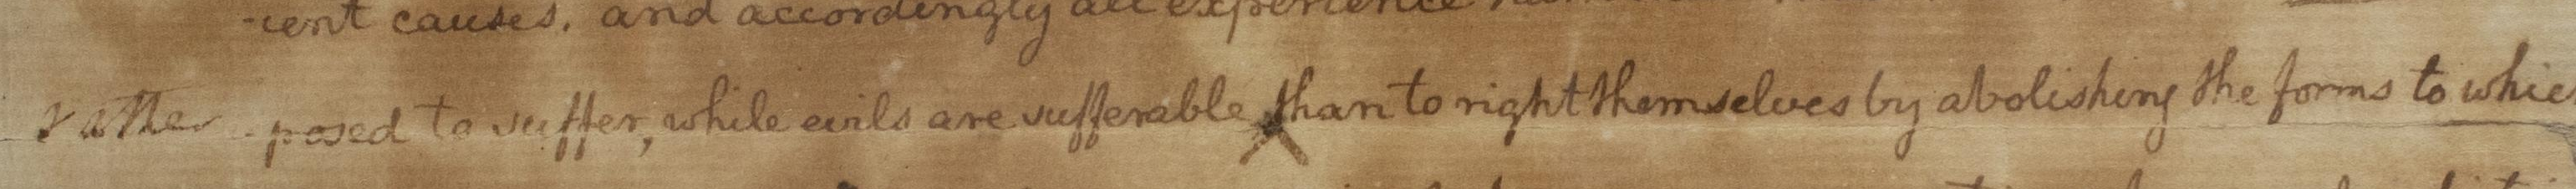-posed to suffer, while evils are sufferable, than to right themselves by abolishing the forms to which
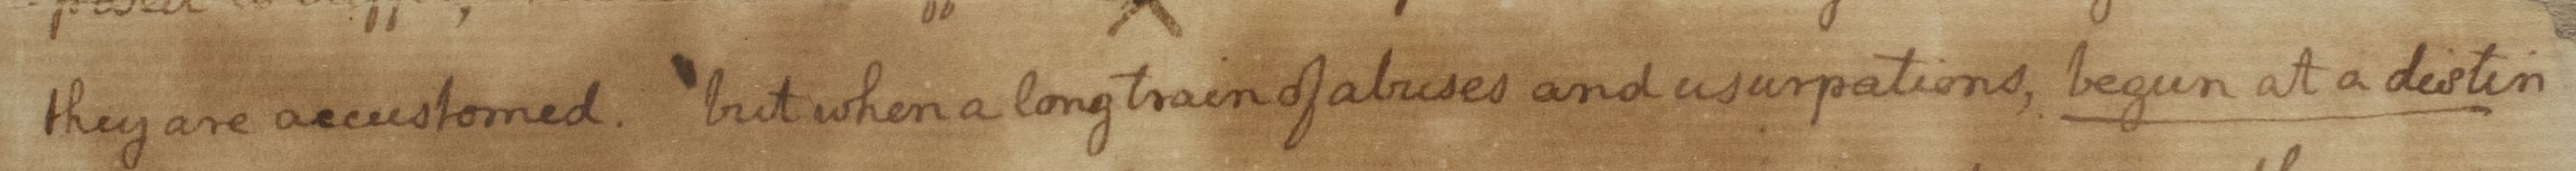they are accustomed. But when a long train of abuses and usurpations, begun at a disten-
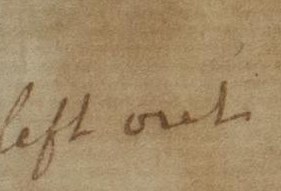left out
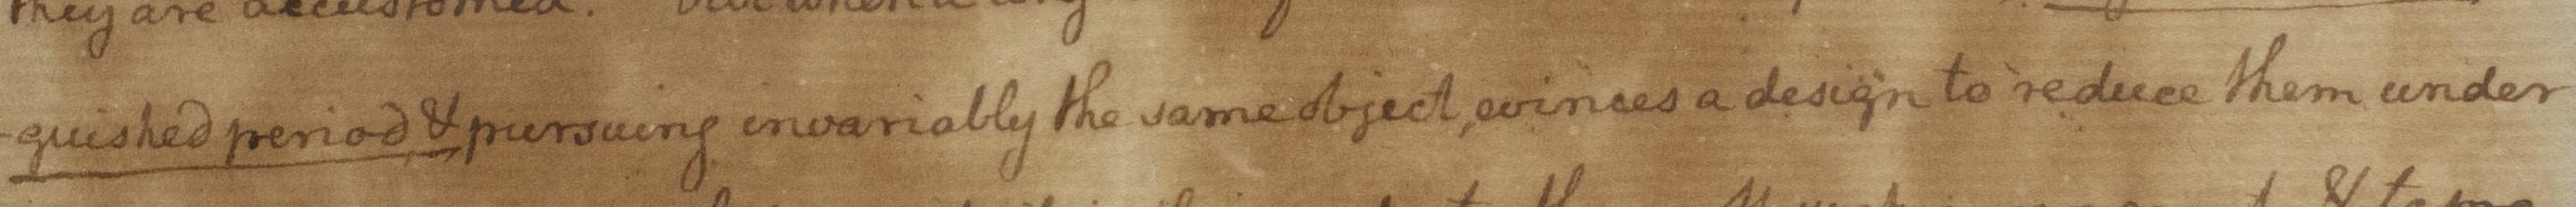-guished period & pursuing invariably the same object evinces a design to reduce them under
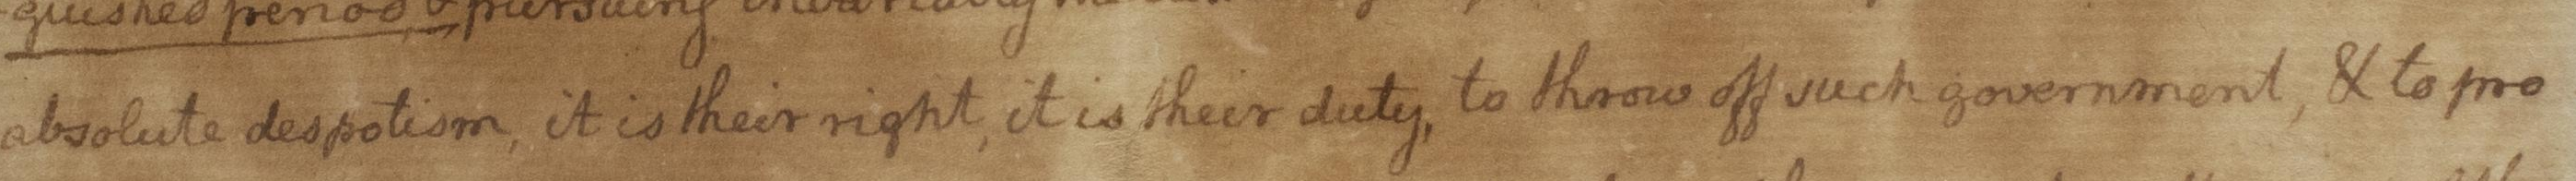absolute despotism, it is their right, it is their duty, to throw off such government, & to pro-
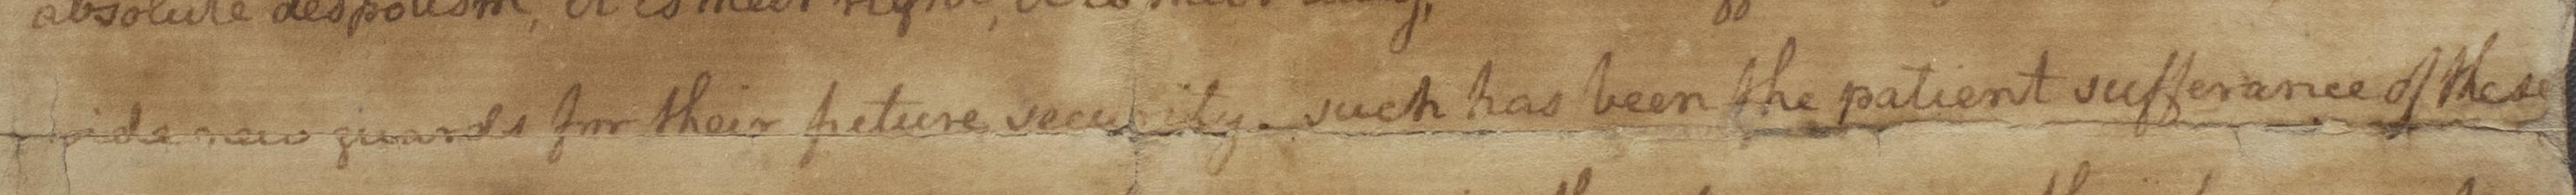-vide new guards for their future security- such has been the patient sufferance of these
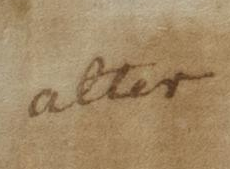alter
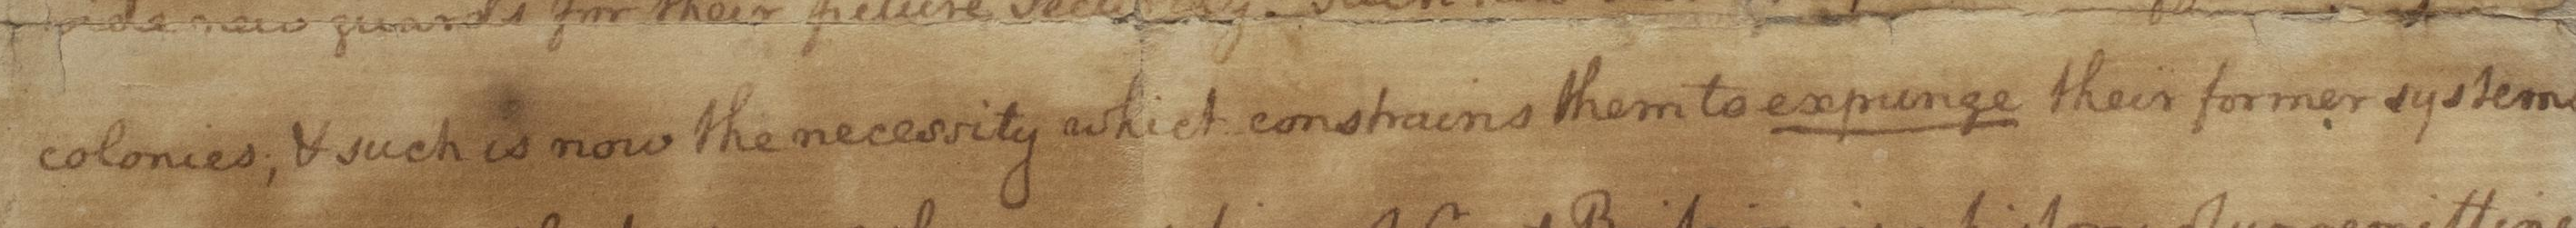colonies, & such is now the necessity which constrains them to exchange their former Systems
